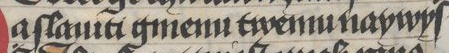a ſlauiti gmenu twemu naywyẛ¬
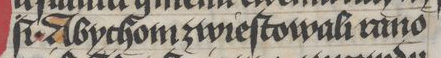ẛi.Abychom zwieſtowali rano
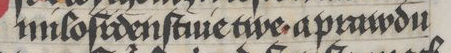miloſrdenſtuíe twe.a prawdu
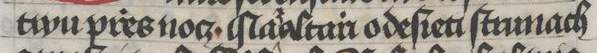twu pṙes nocz.Nazaltaṙi odeſieti ſtrunach
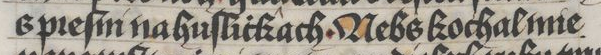s pieſni nahuſliċkach.Nebs kochal mie
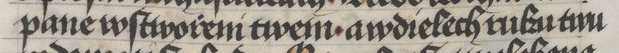pane wſtwoṙeni twem.a wdielech ruku twu
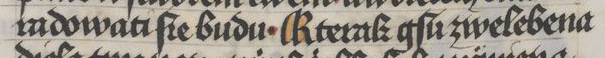radowati ſie budu.Kterak gſu zwelebena
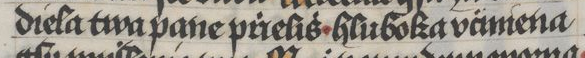diela twa pane pṙieliṡ.hluboka vċiniena
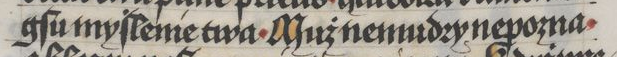gſu myẛlenie twa.Muż nemudry nepozna.
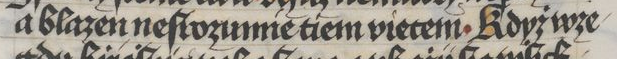a blazen neſrozumie tiem viecem.Kdyż wze¬
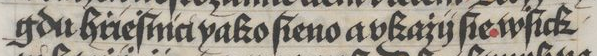gdu hṙieẛníci yako ſieno a vkażij ſie.wẛick¬
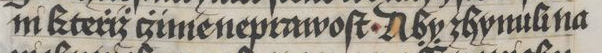ni kteṙiż cżinie neprawoſt.Aby zhynuli na
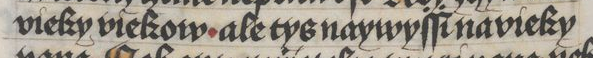vieky viekow.ale tys naywyẛẛi navieky
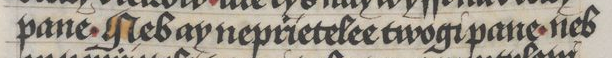pane.Neb ay nepṙietelee twogi pane.neb
